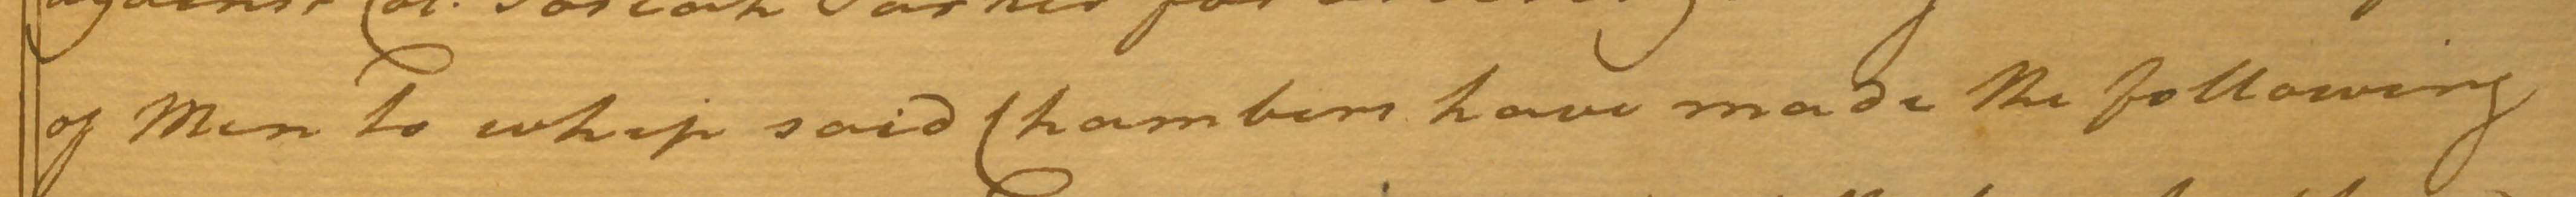of Men to whip said Chambers have made the following
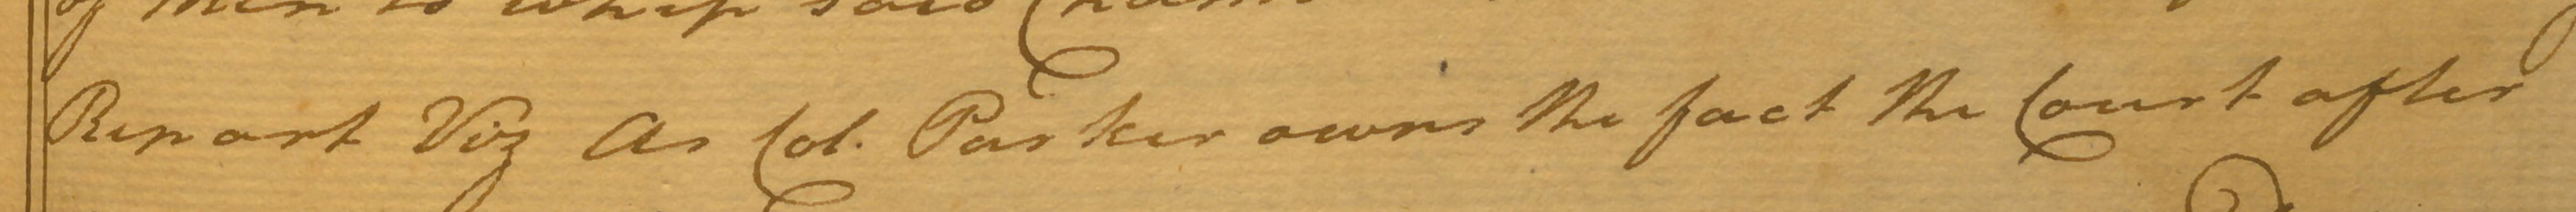Report Viz As Col. Parker owns the fact the Court after -
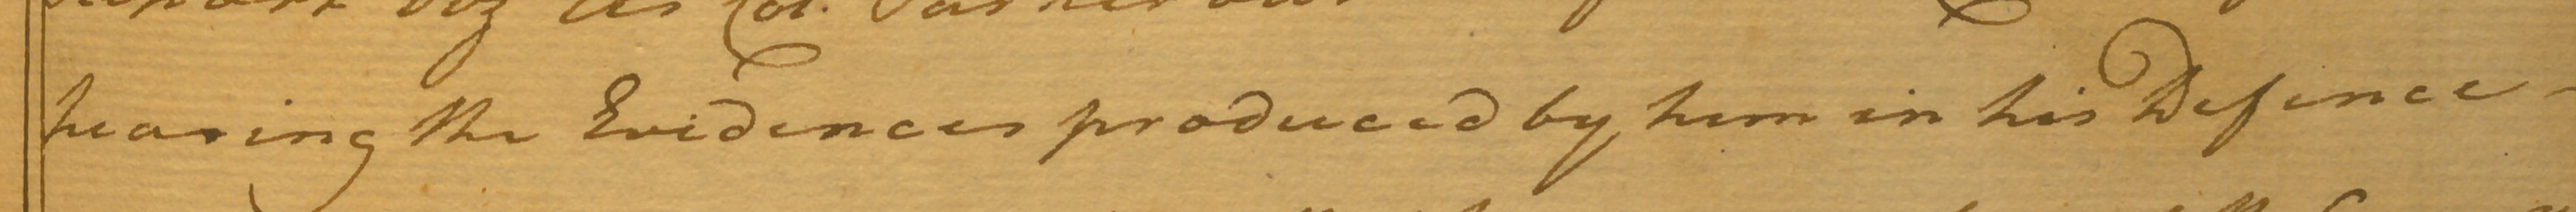hearing the Evidence produced by him in his Defence
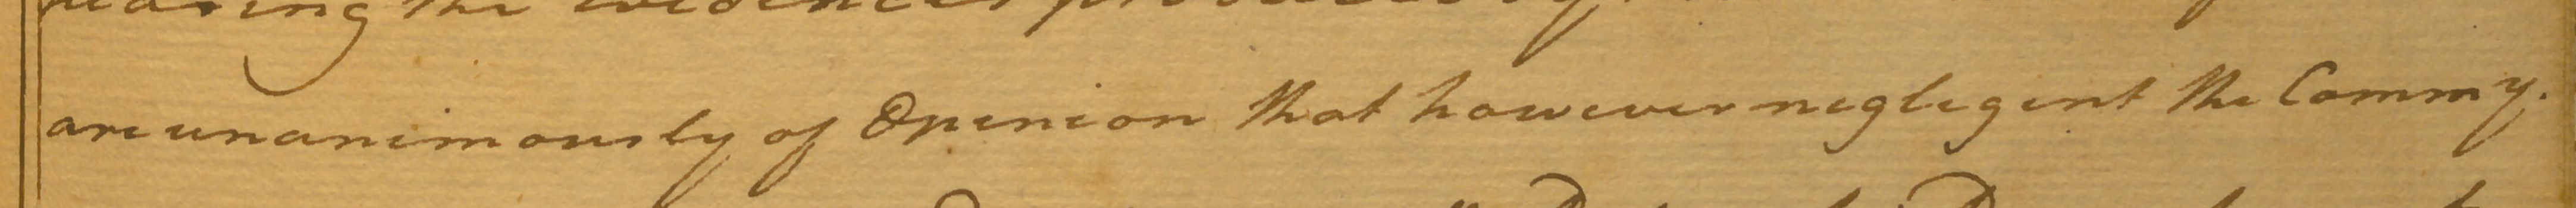are unanimously of Opinion that however negligent the Comm^y.
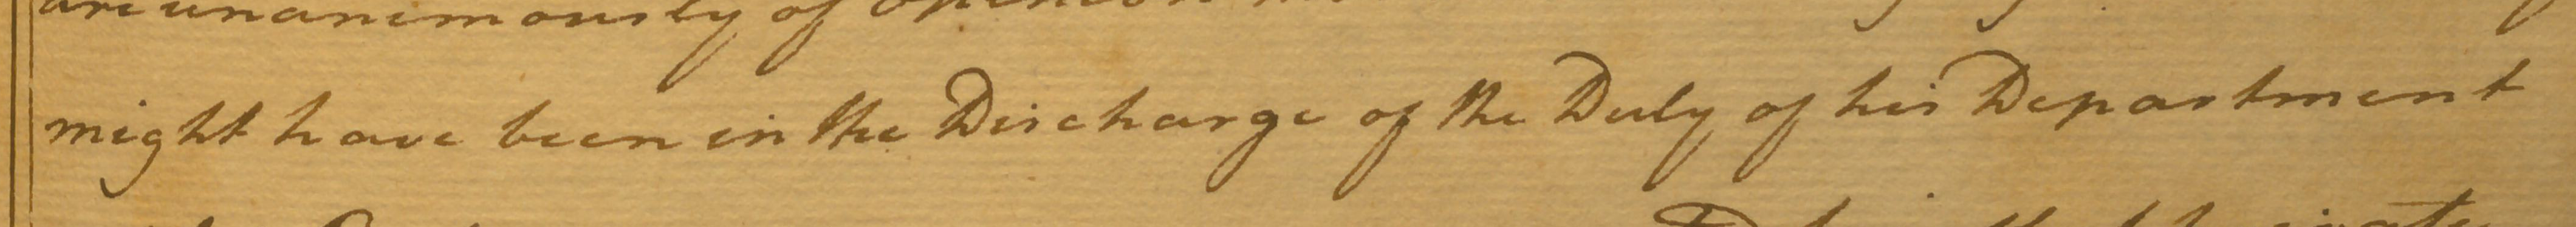might have been in the Discharge of the Duty of his Department
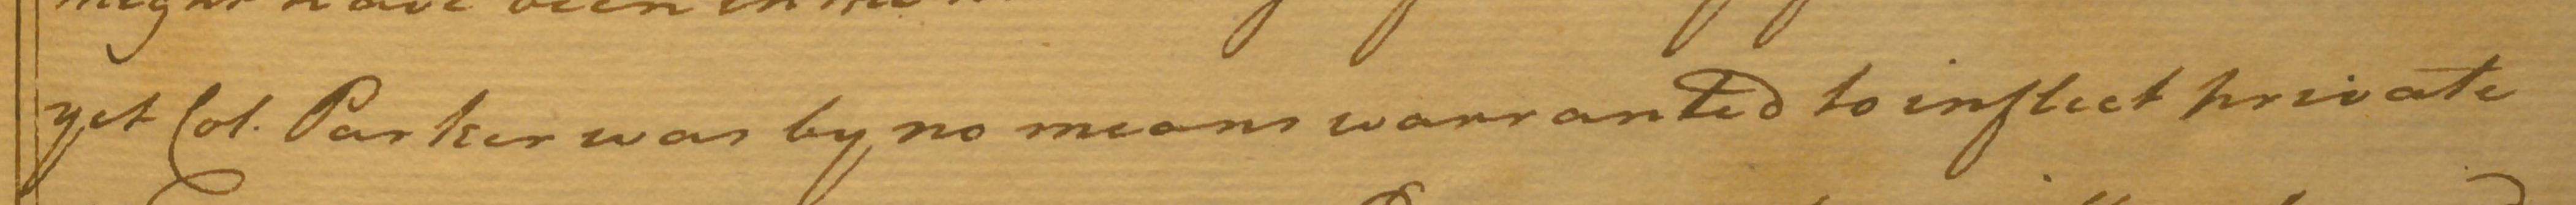yet Col. Parker was by no means warranted to inflict private
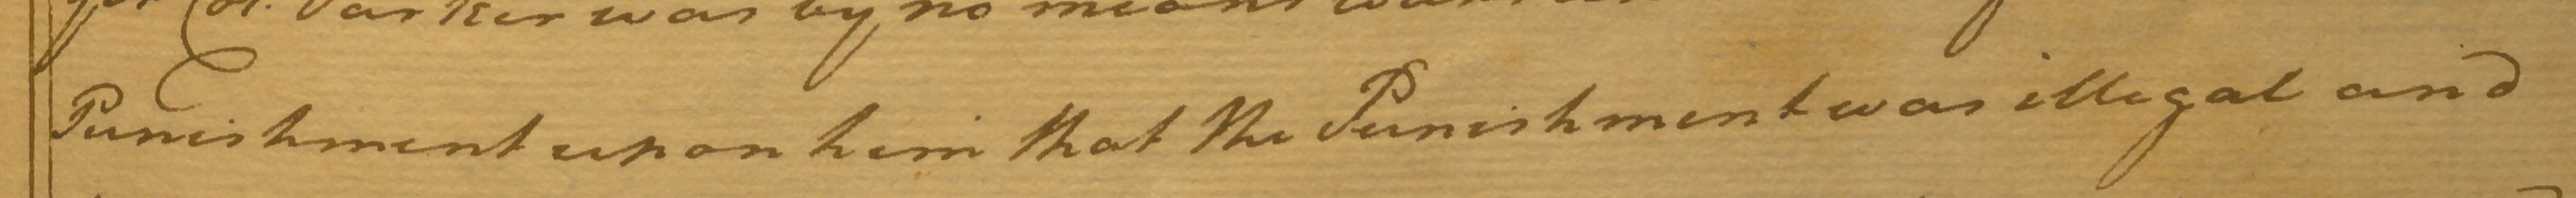Punishment upon him that the Punishment was illegal and
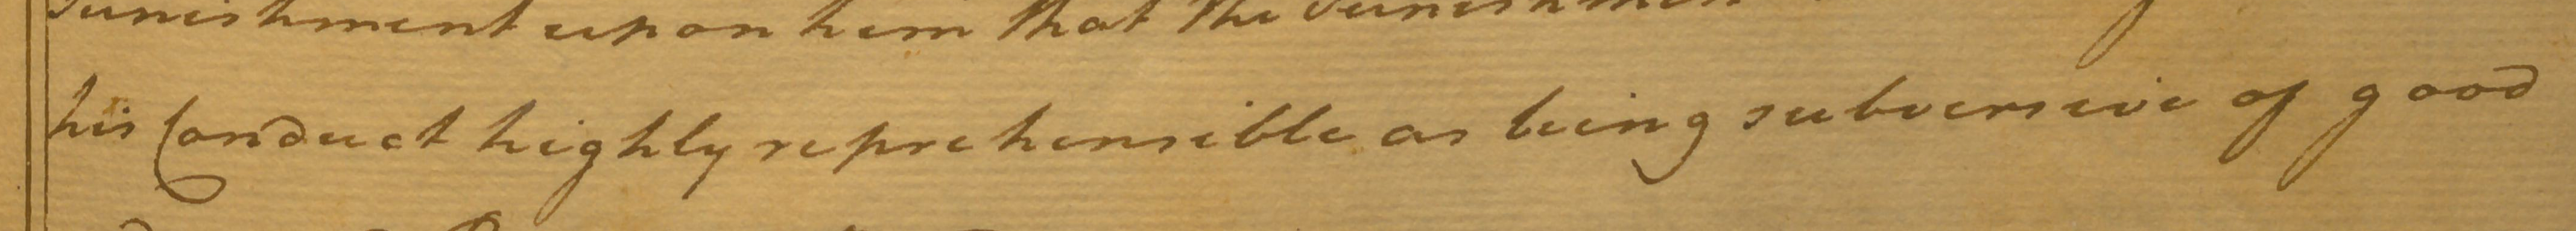his Conduct highly reprehensible as being subversive of good
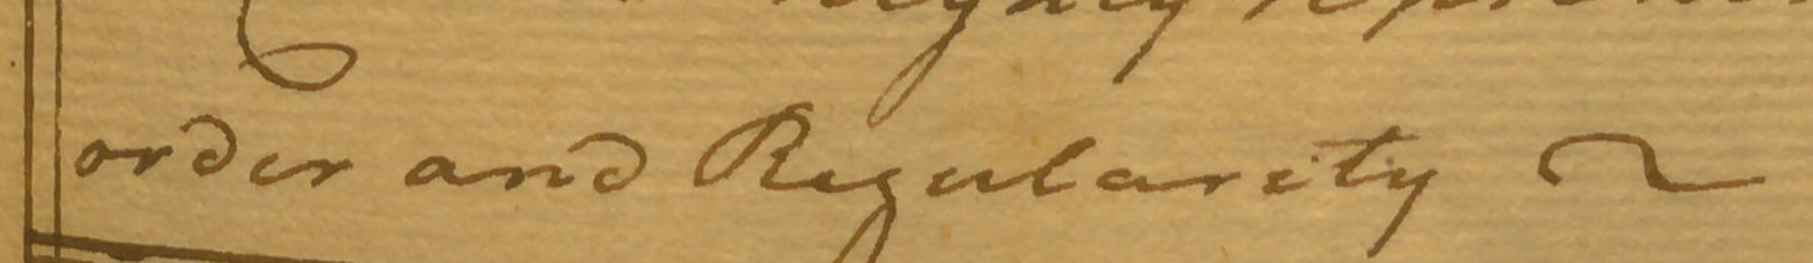order and Regularity -
